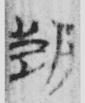折
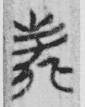鹿（戮）
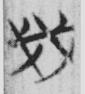戔（殘）
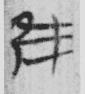隹（惟）
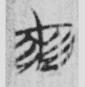𪪋（災）
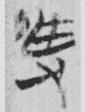{尸拃}
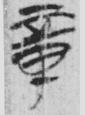章（彰）
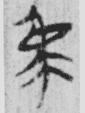象
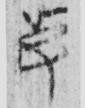皮（彼）
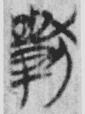獸
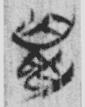鼠
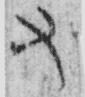又
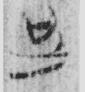足
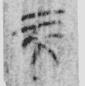而
